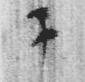十
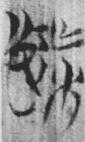殜（世）
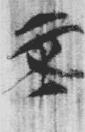不
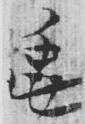○（仁）
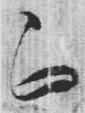㠯（以）
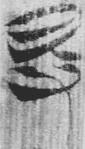𠭁
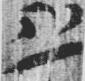之
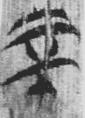不
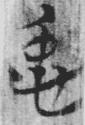○（仁）
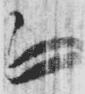㠯（以）
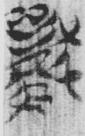獸（守）
